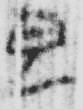也
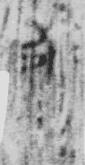○（厚）
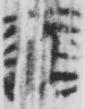○（聞）
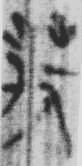○（笑）
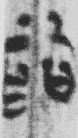○（聲）
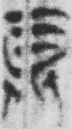鼎（則）
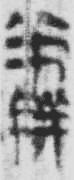羴（鮮）
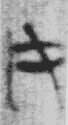女（如）
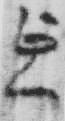也
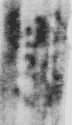斯
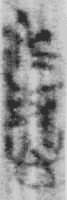憙（喜）
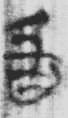昏（聞）
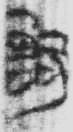訶（歌）
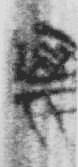要（謠）
